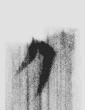人
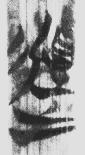道
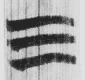三
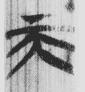天
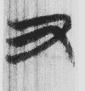又
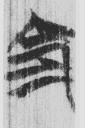命
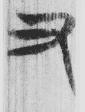又
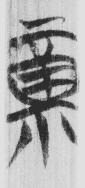福
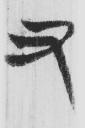又
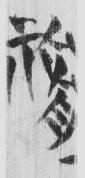禍
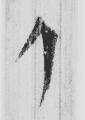人
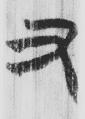又
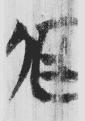佴
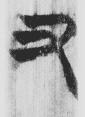又
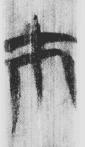巿
